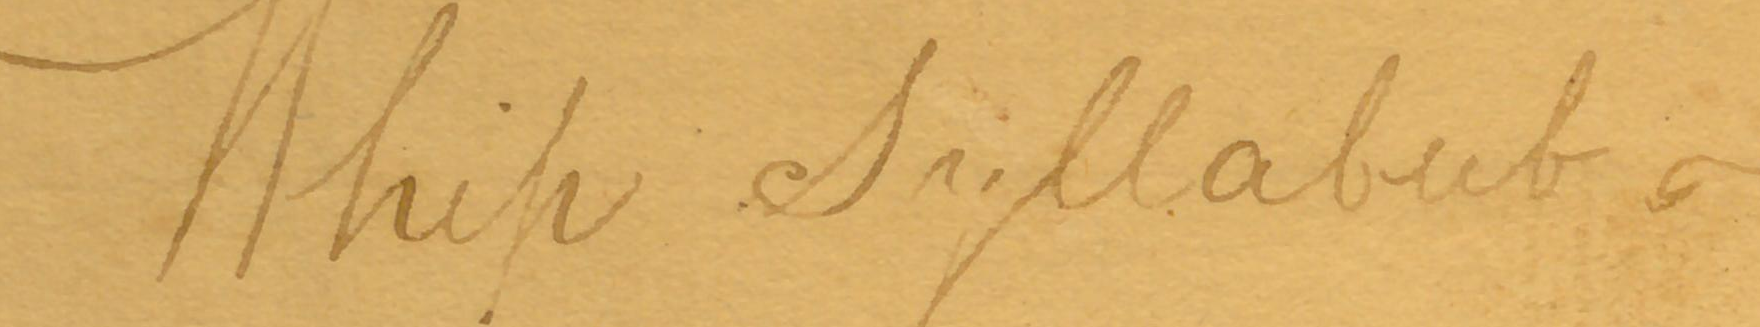Whip Syllabub
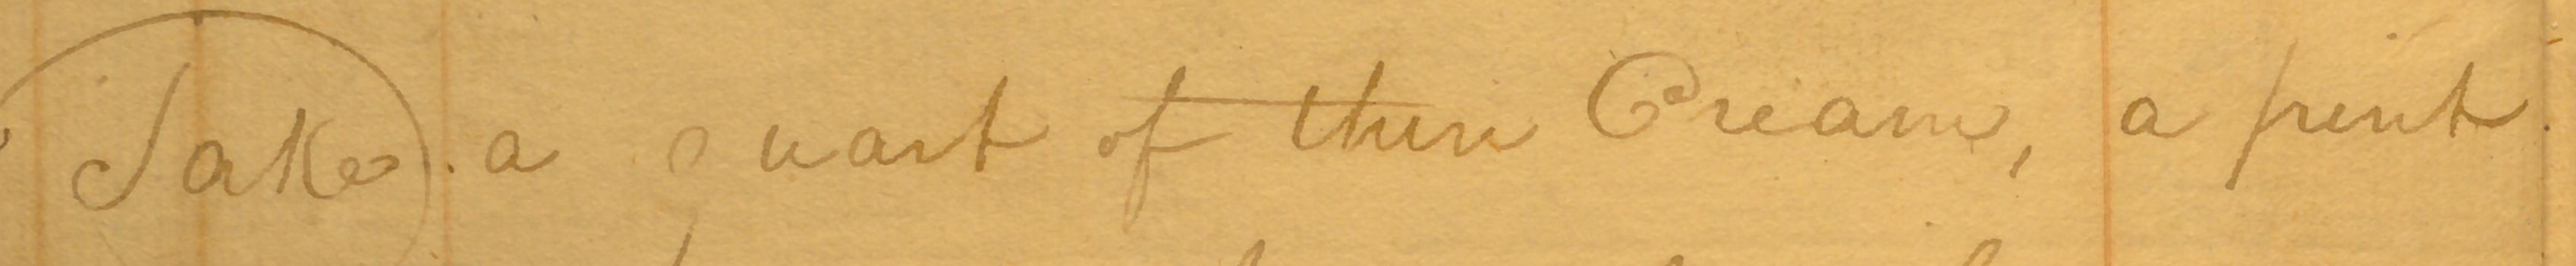Take a quart of thin Cream, a pint
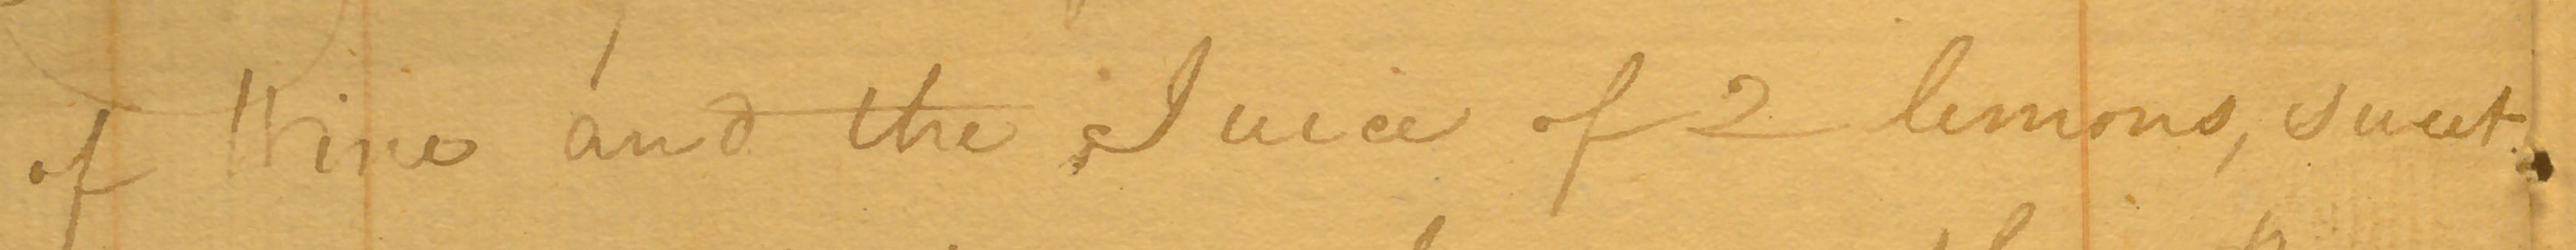of Wine and the Juice of 2 lemons, sweet
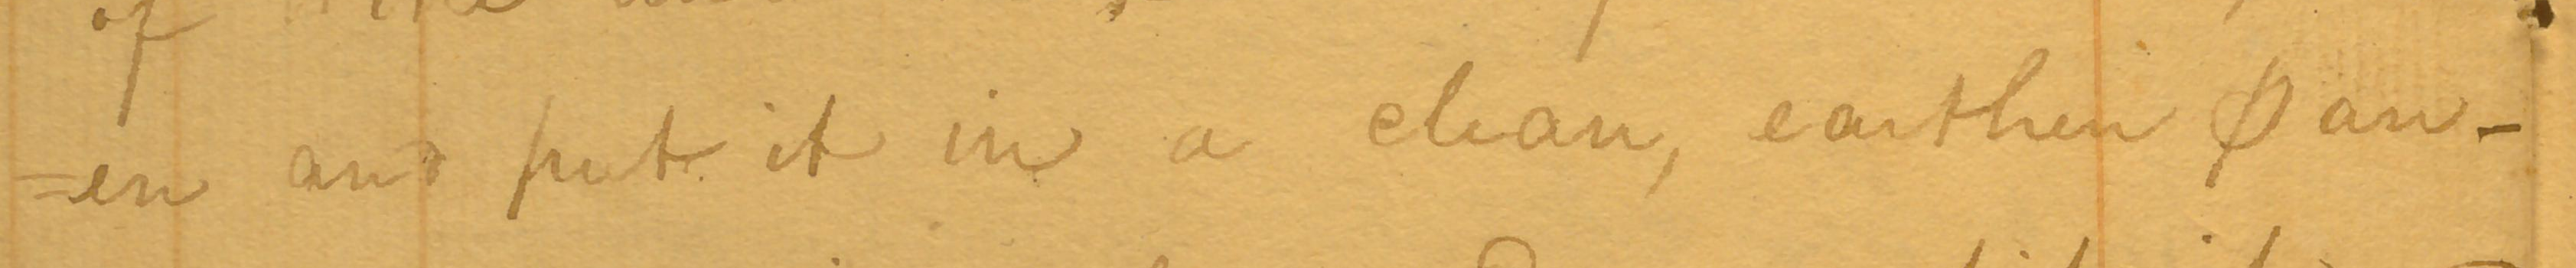-en and put in a clean, earthen pan-
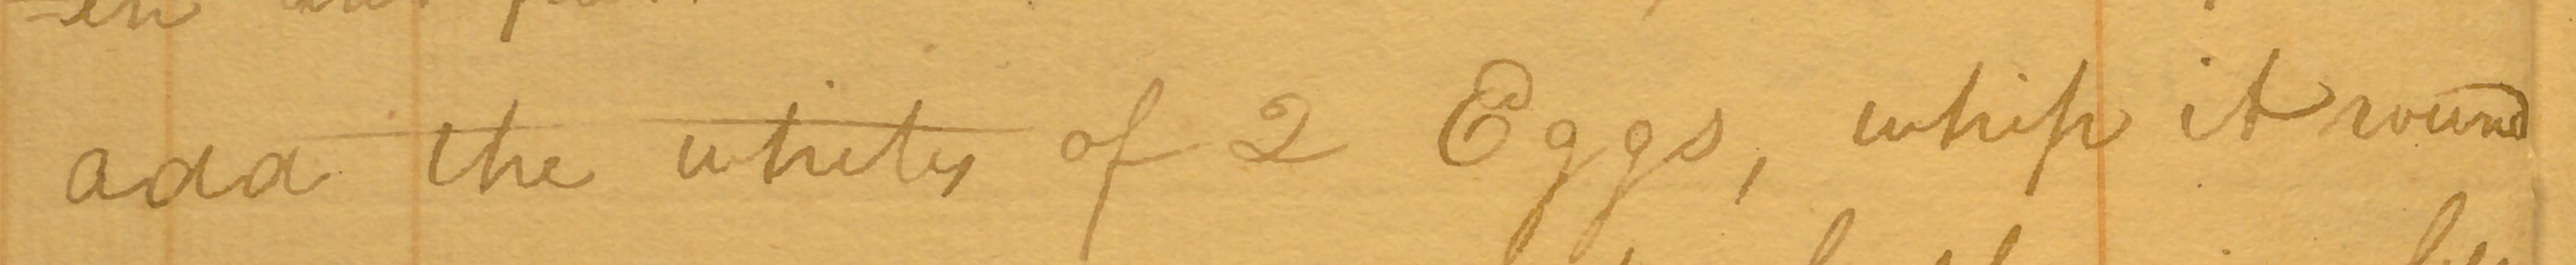add the whites of 2 Eggs, whip it round
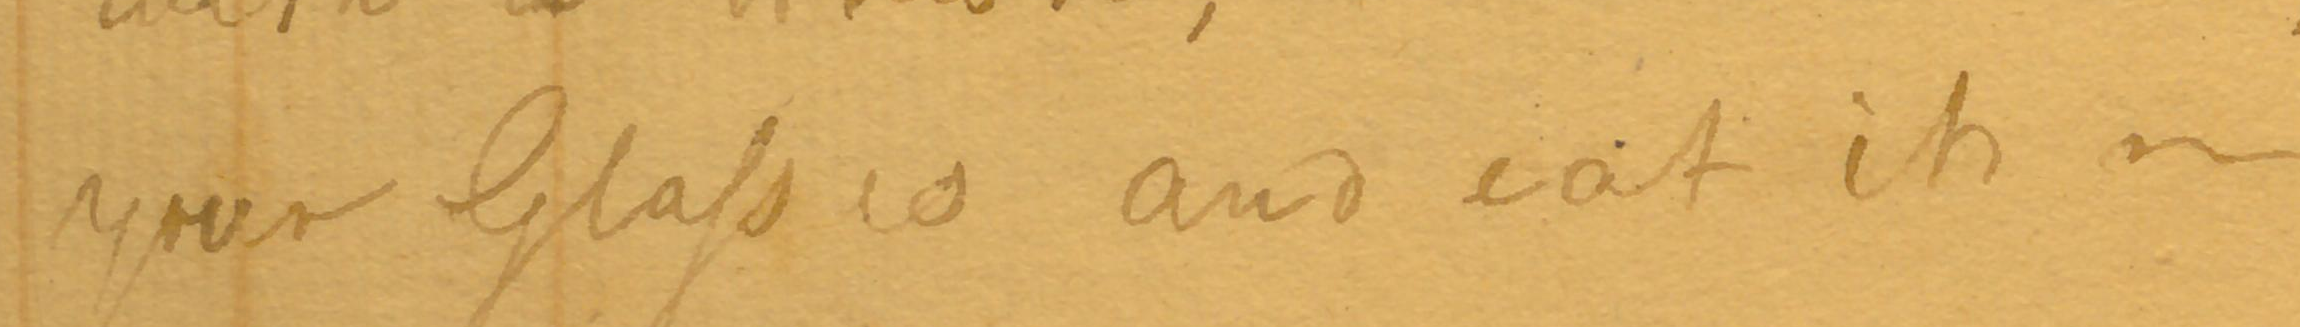your Glasses and eat it-
